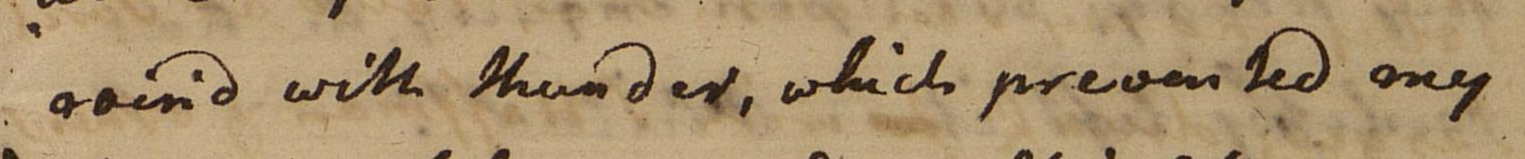raind with thunder, which prevented my
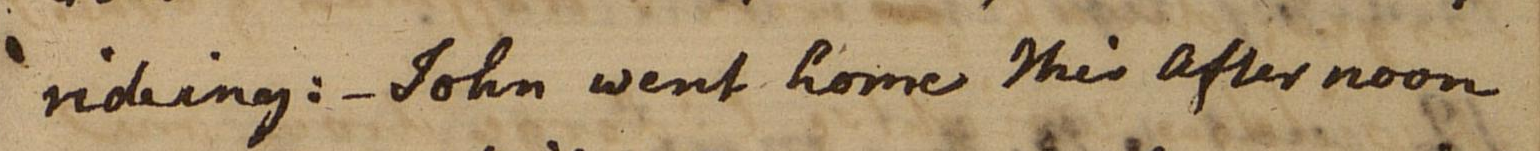riding:- John went home this afternoon
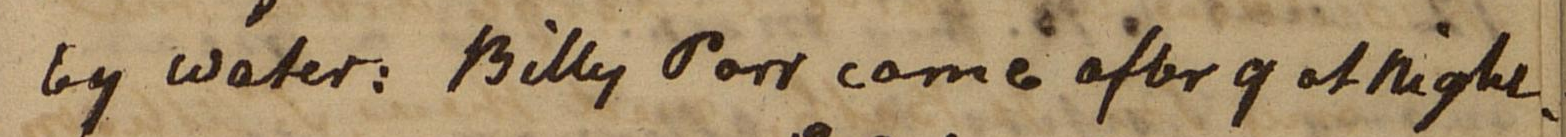by water: Billy Parr came after 9 at Night.
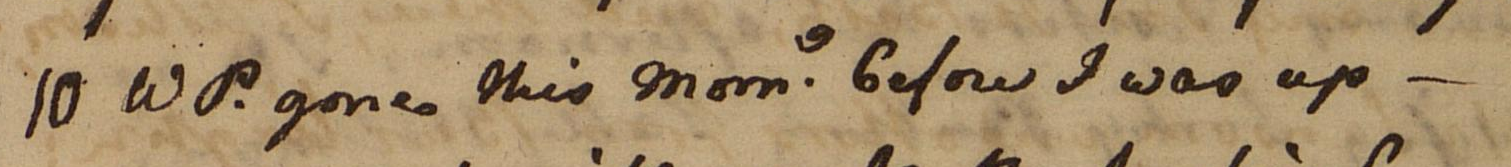10 W P. gone this morn^g. before I was up-
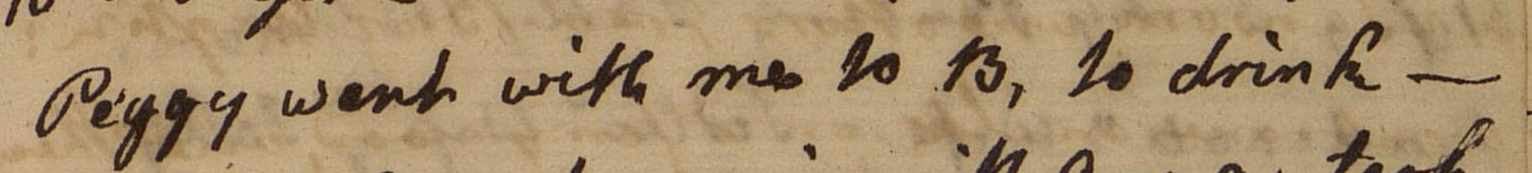Peggy went with me B, to drink-
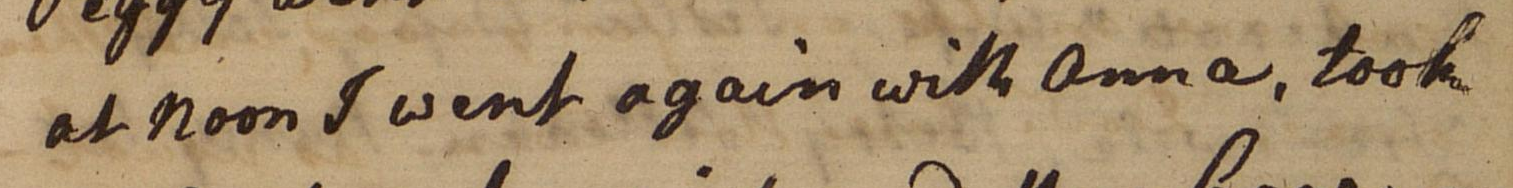at noon I went again with Anna, took
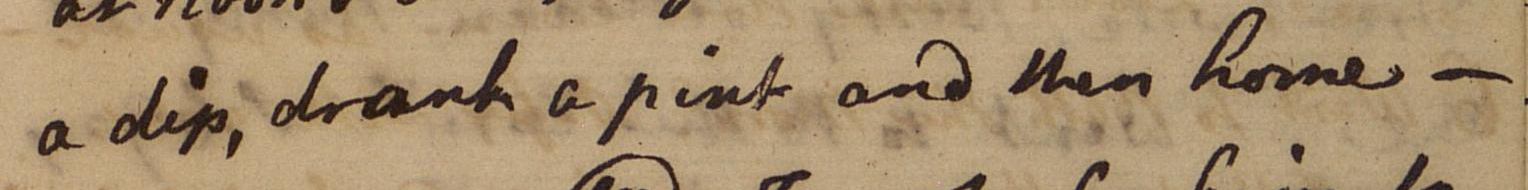a dip, drank a pint and then home-
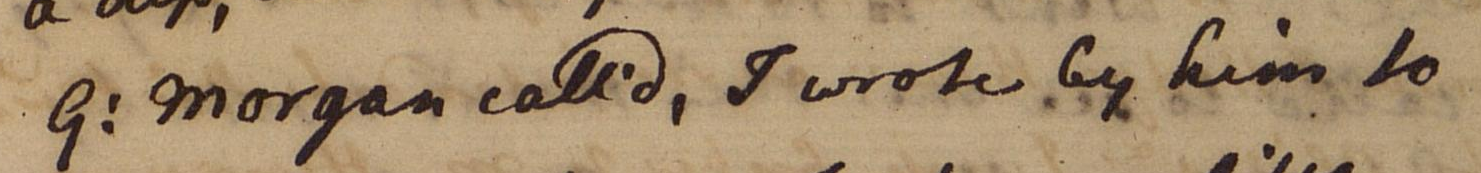G: Morgan call'd, I wrote by him to
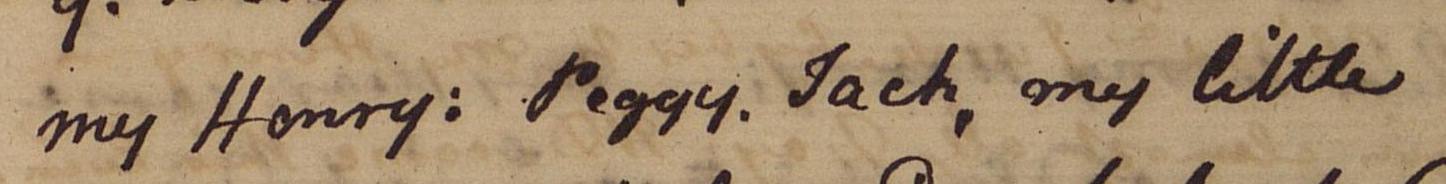my Henry: Peggy. Jack, my little
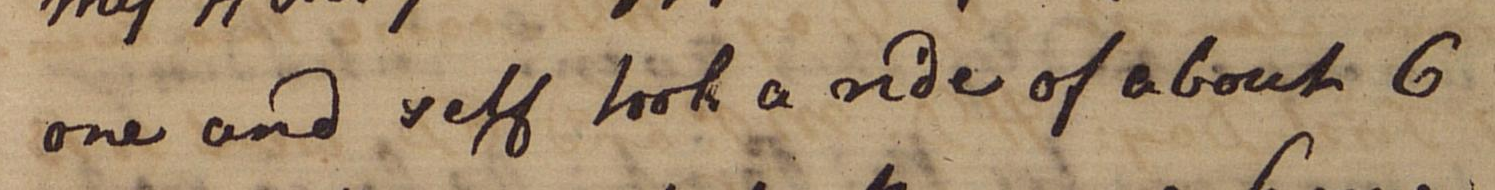one and self took a ride of about 6
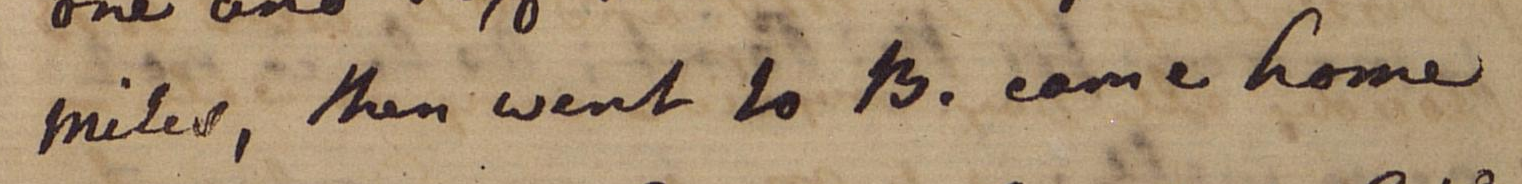miles, then went to B. came home
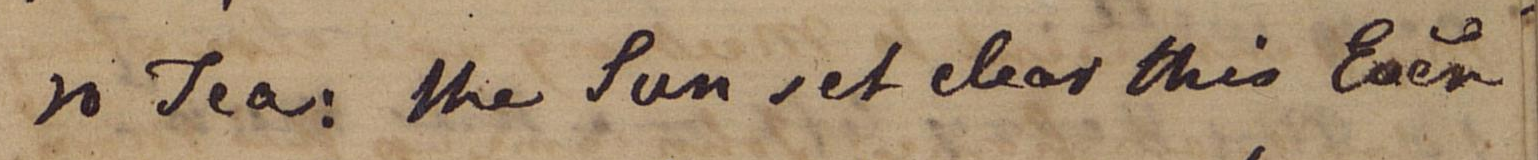to Tea: the sun set clear this Even^g
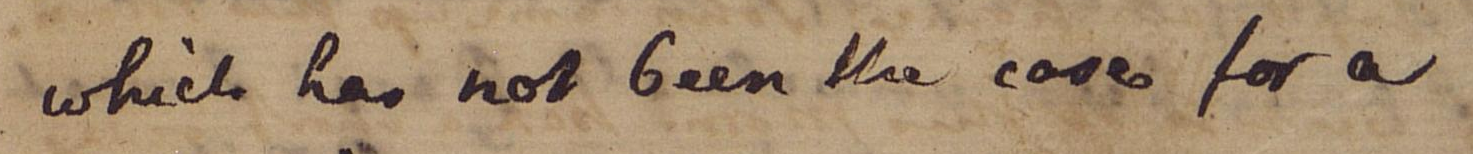which has not been the case for a
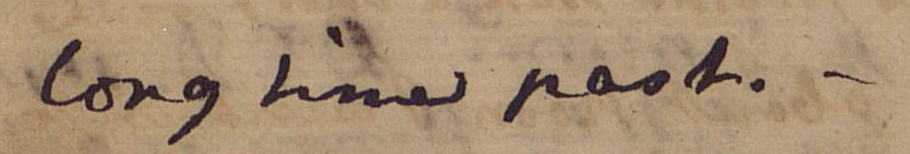long time past.-
